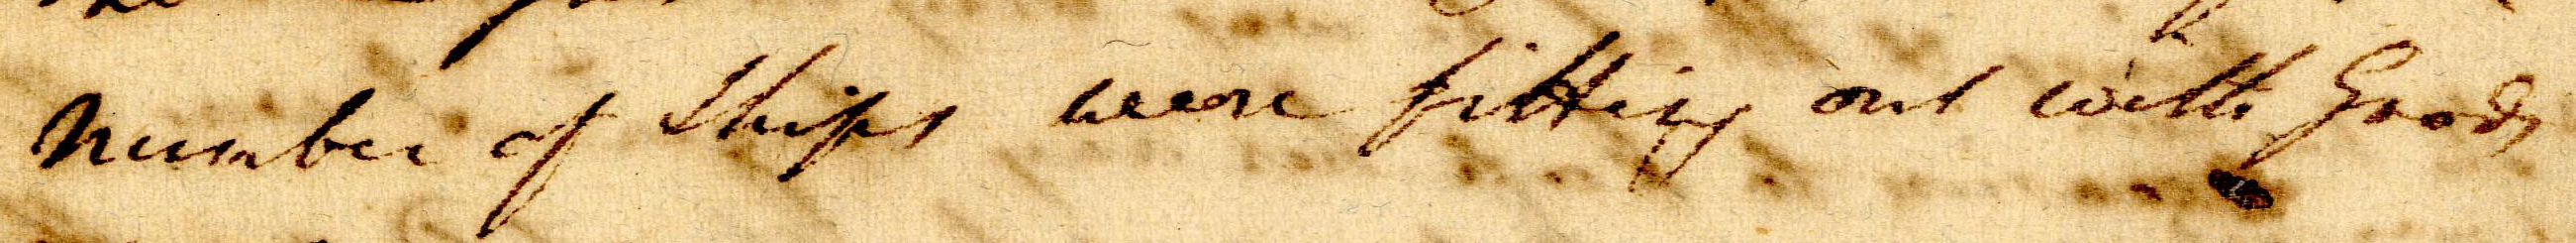Number of Ships were fitting out with Gods
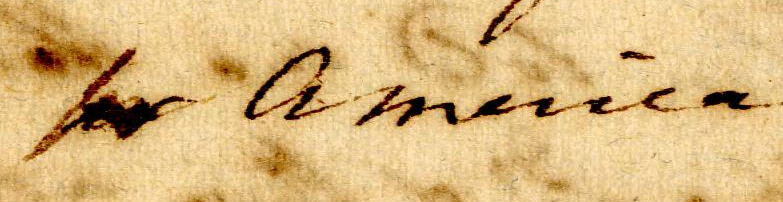or America
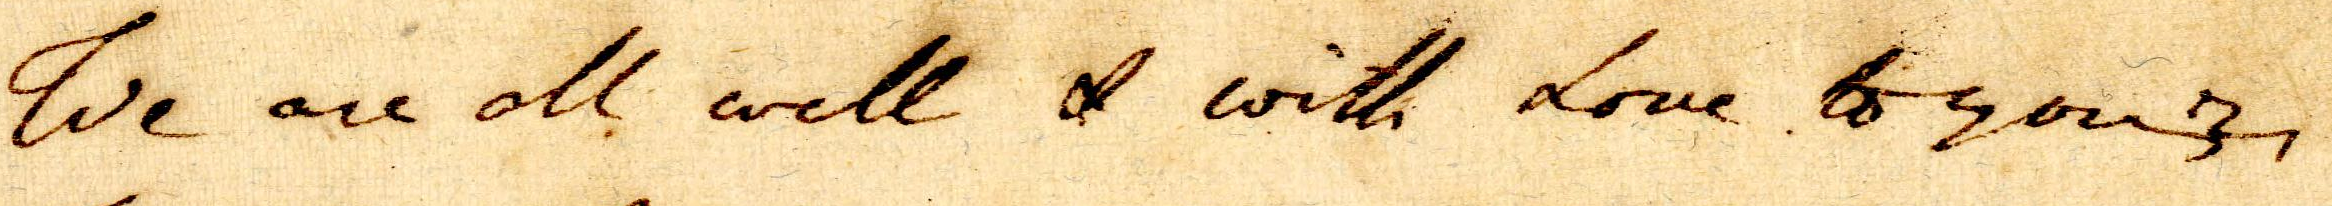We are all well & wish Love to your
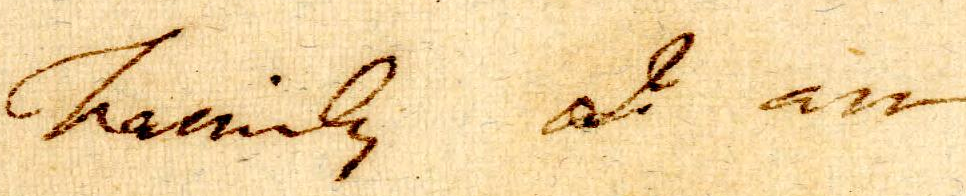Family a^l an
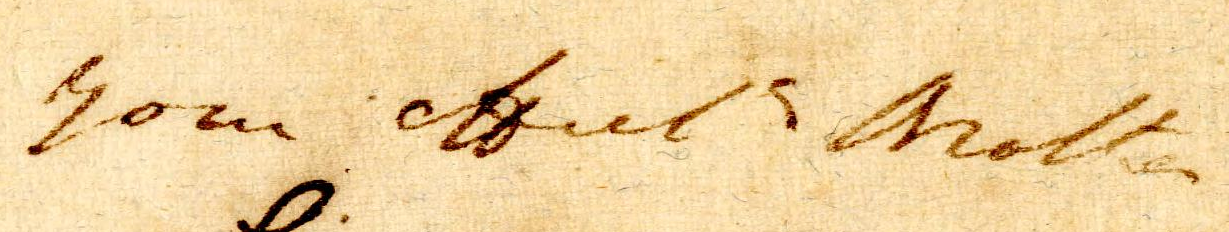your affect^e Brother
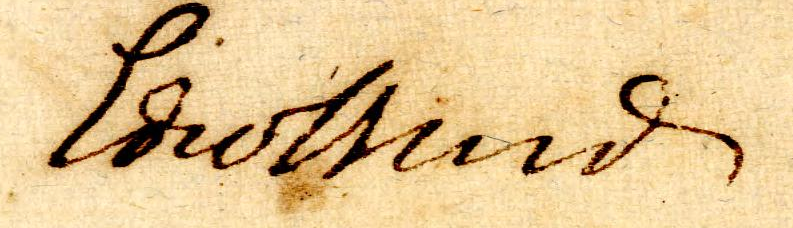Edw Burd
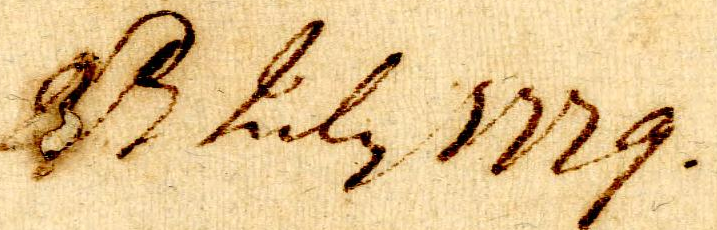Phily 1779
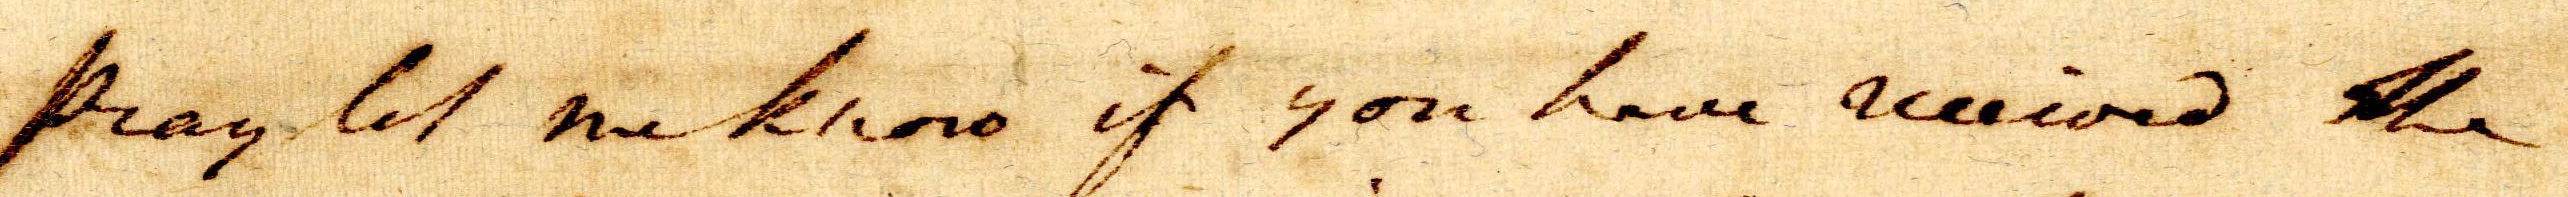Pray let me know if you have received the
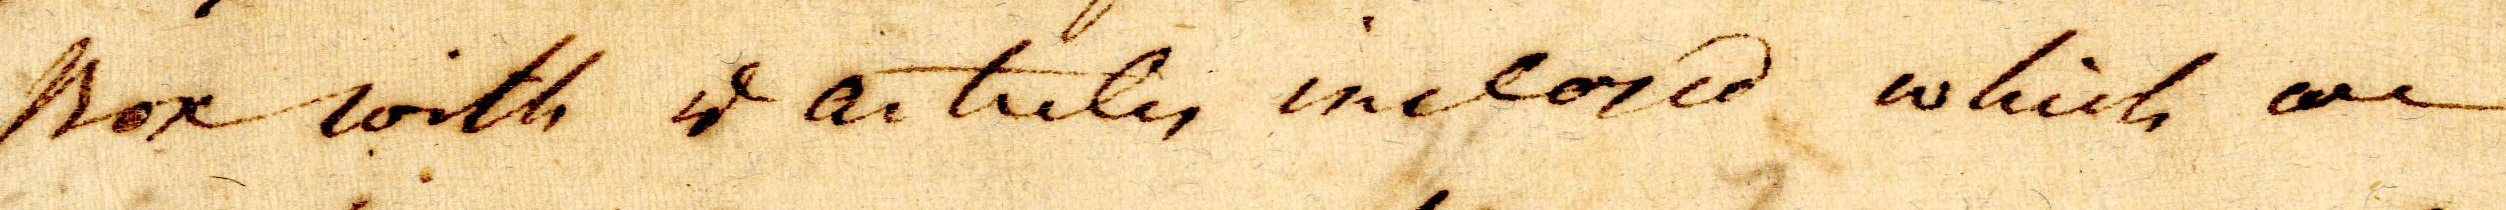Box with y^e articles inclosed which are
